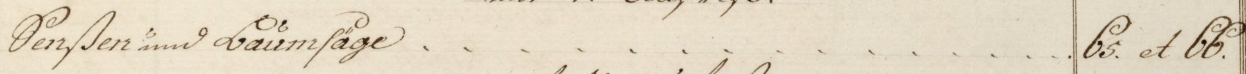Senßen und Baumsäge. 65. et 66.
